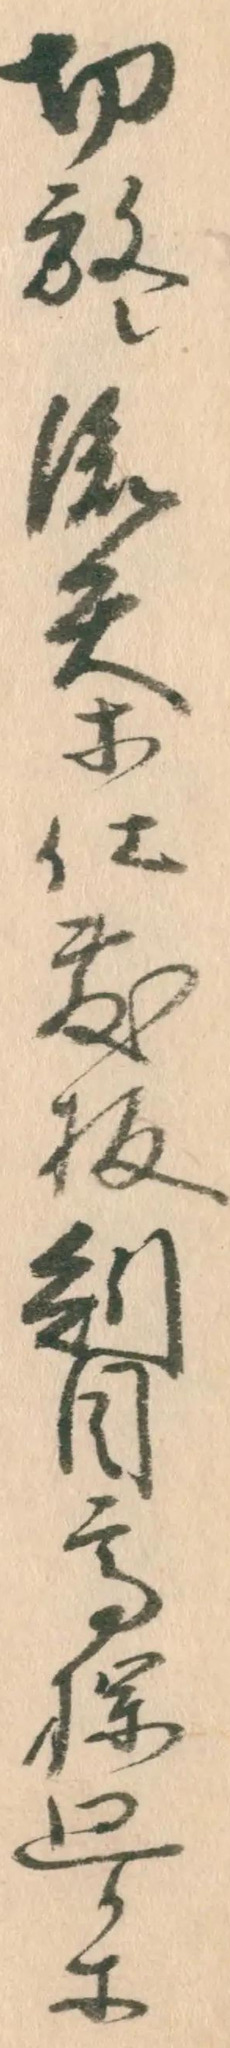切放れ流失等仕敷板組目高欄廻り等
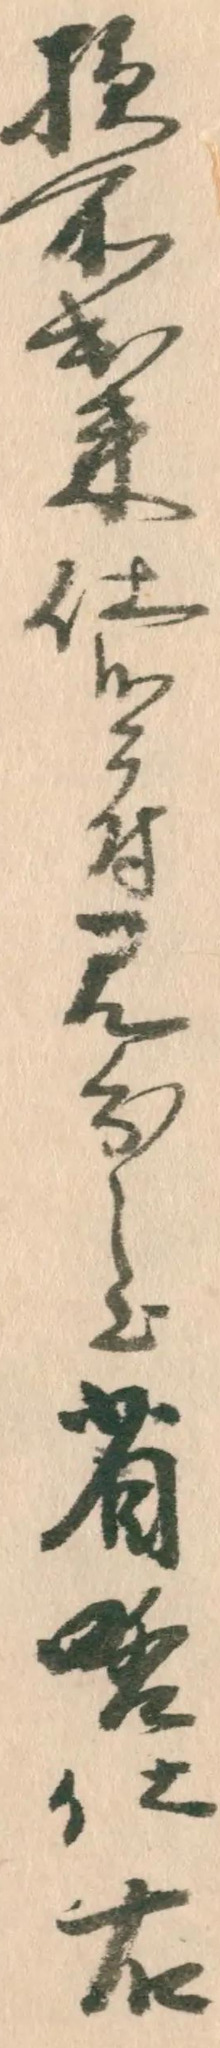損所出来仕候ニ付見分之上省略仕右
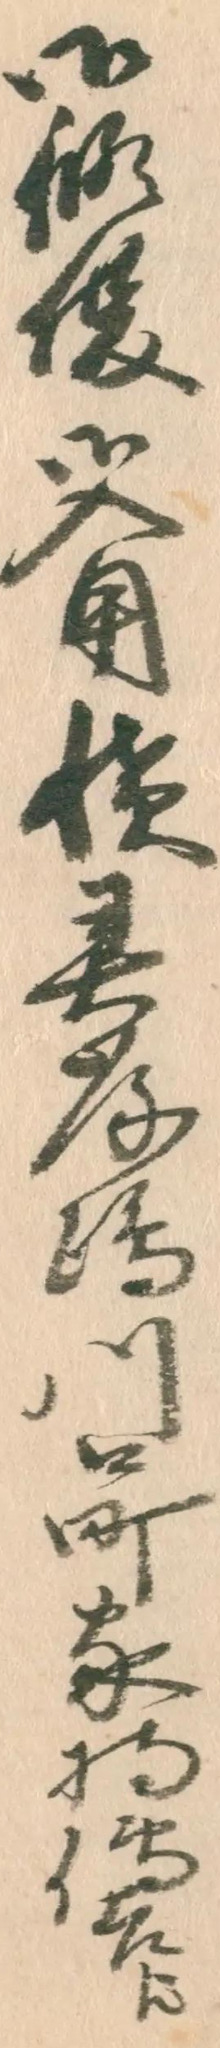御修復御入用積霊岸島川口町家持伝吉え
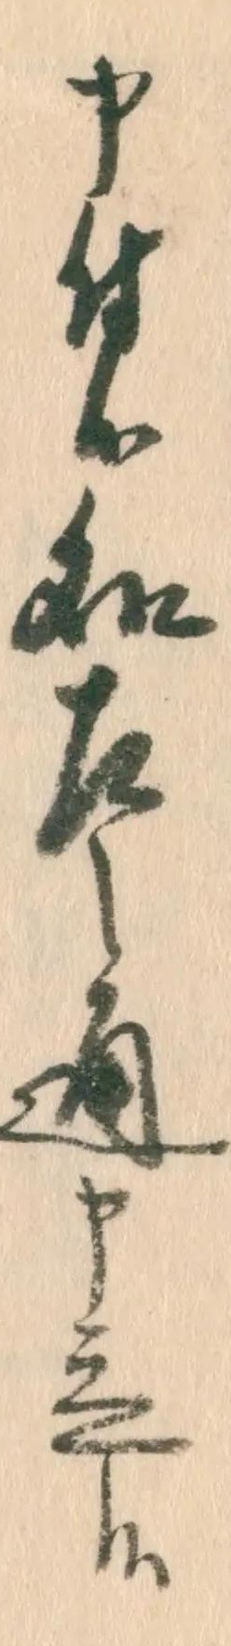申付候処左之通申立候
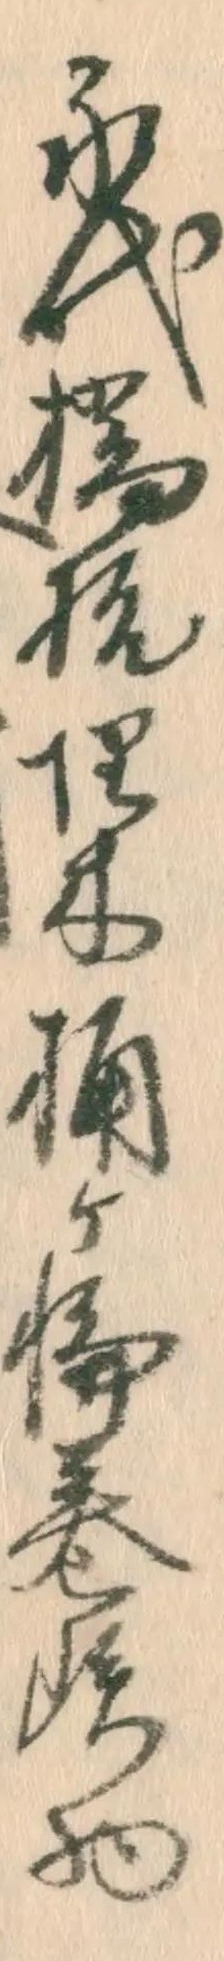永代橋杭埋木桶ケ輪巻鉄物
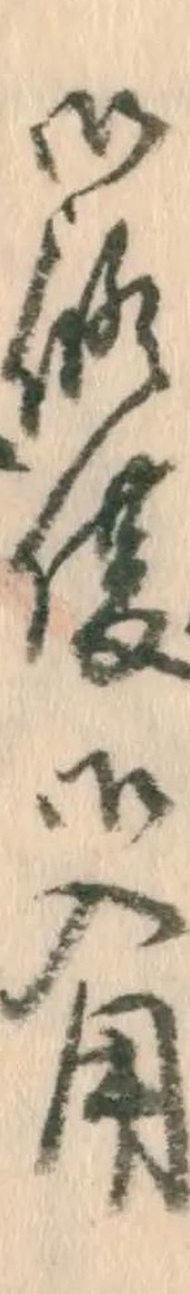御修復御入用
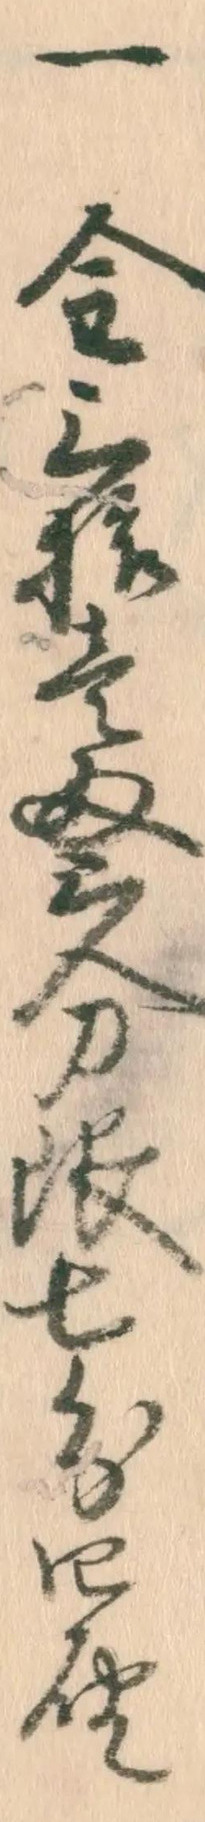一金三拾壱両三分銀七分四厘
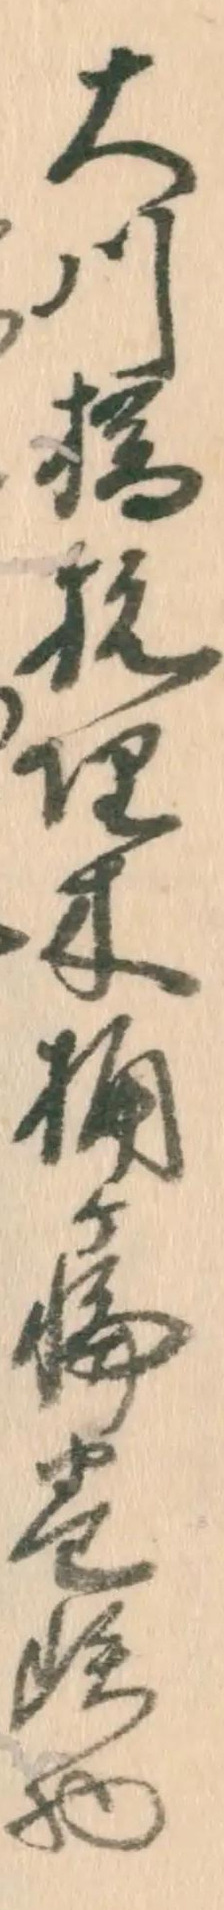大川橋杭埋木桶ケ輪巻鉄物
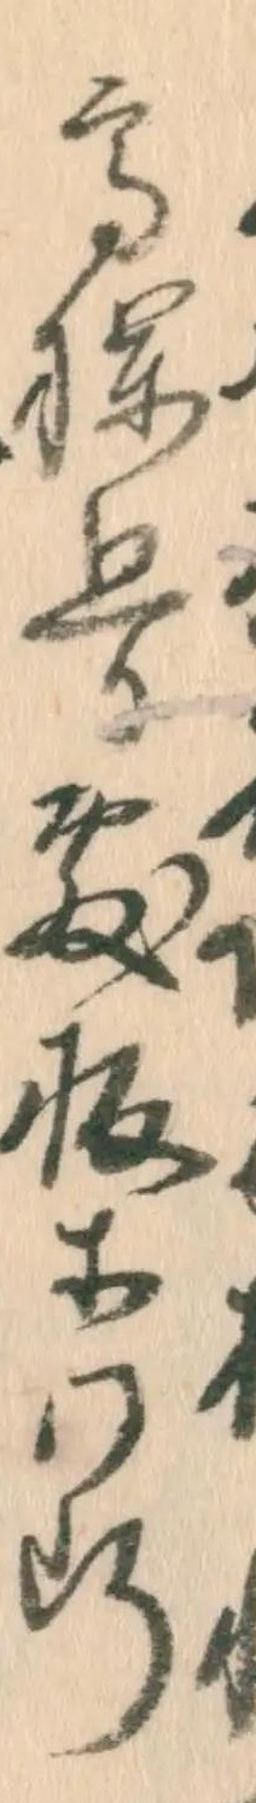高欄廻り敷板等同断
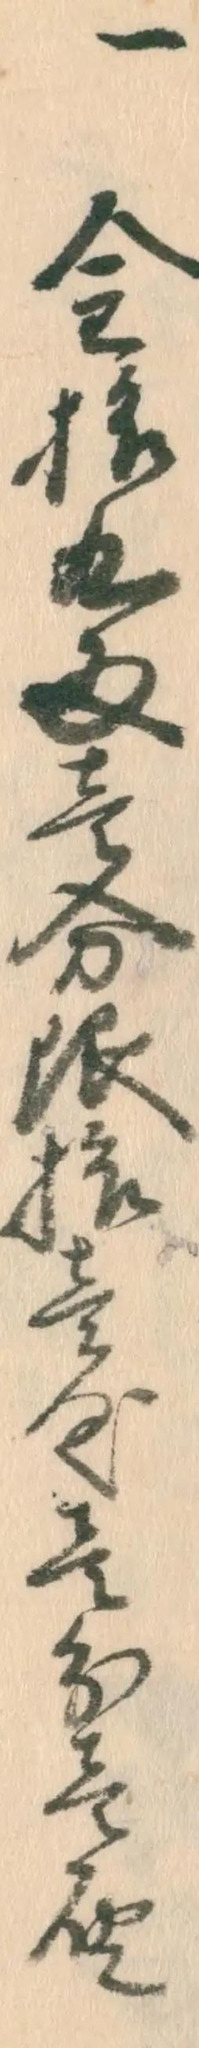一金拾九両壱分銀拾壱匁壱分壱厘
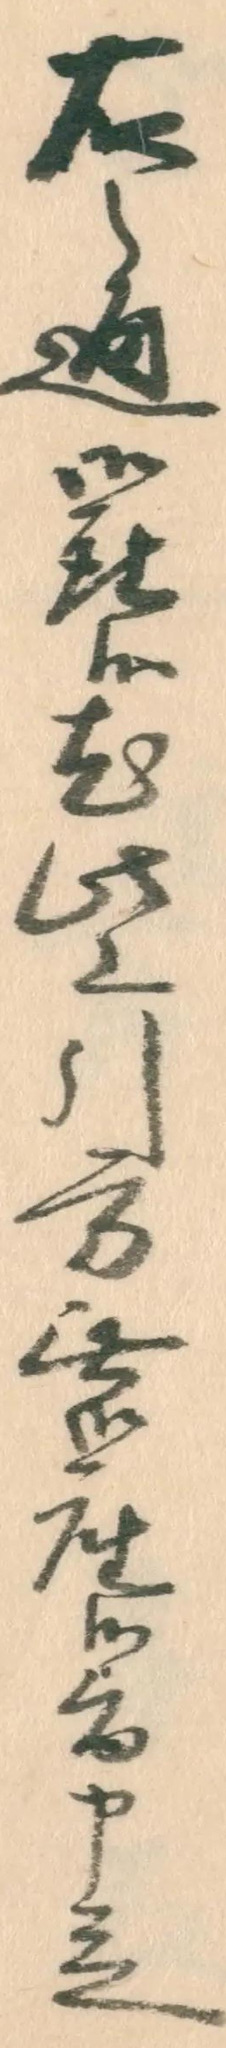右之通御座候尤此上引方無御座候旨申立
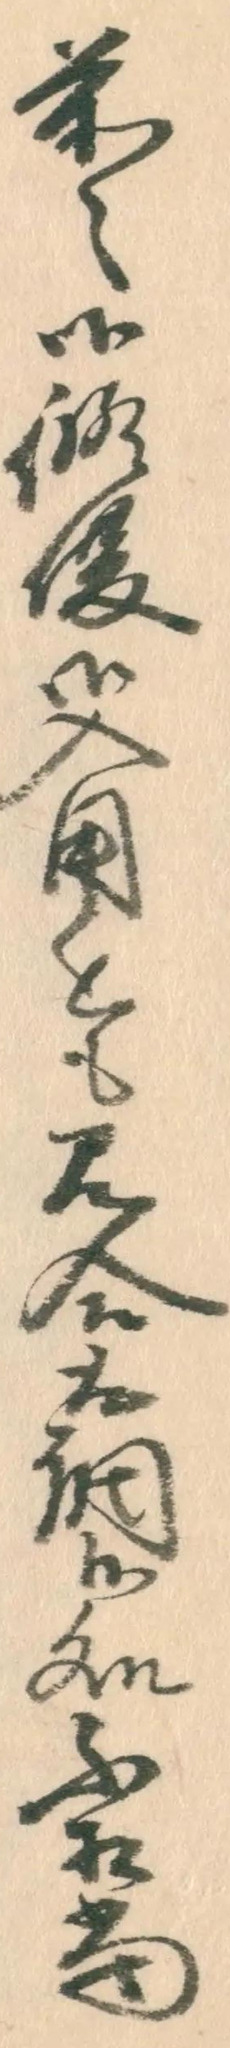前之御修復御入用とも見合取調候処不相当
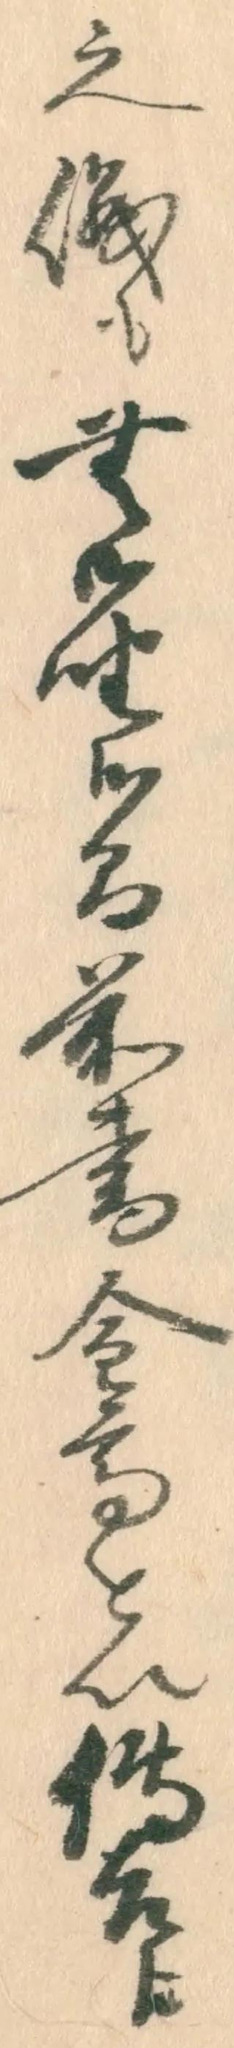之儀も無御座候間前書金高を以伝吉え
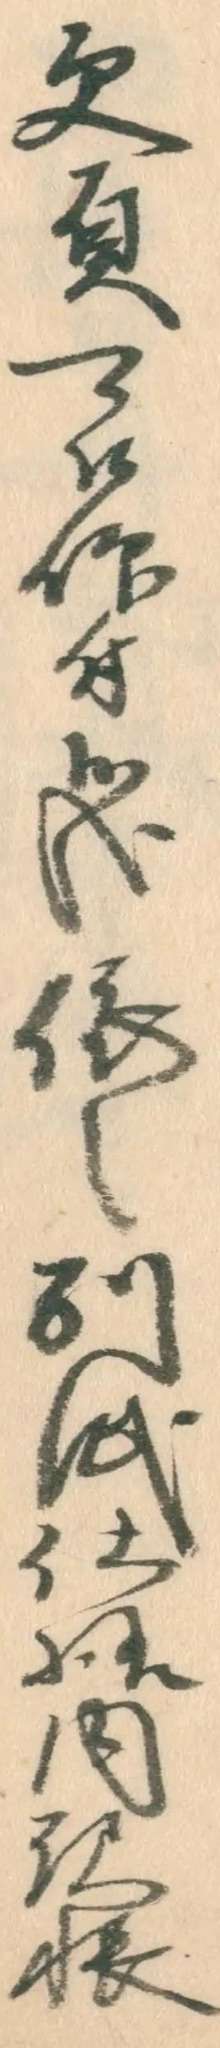受負可被仰付候哉依之別紙仕様内訳帳

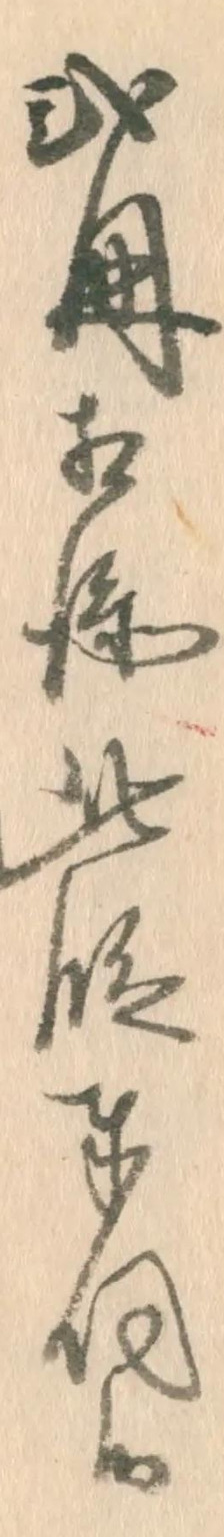弐冊相添此段奉伺候
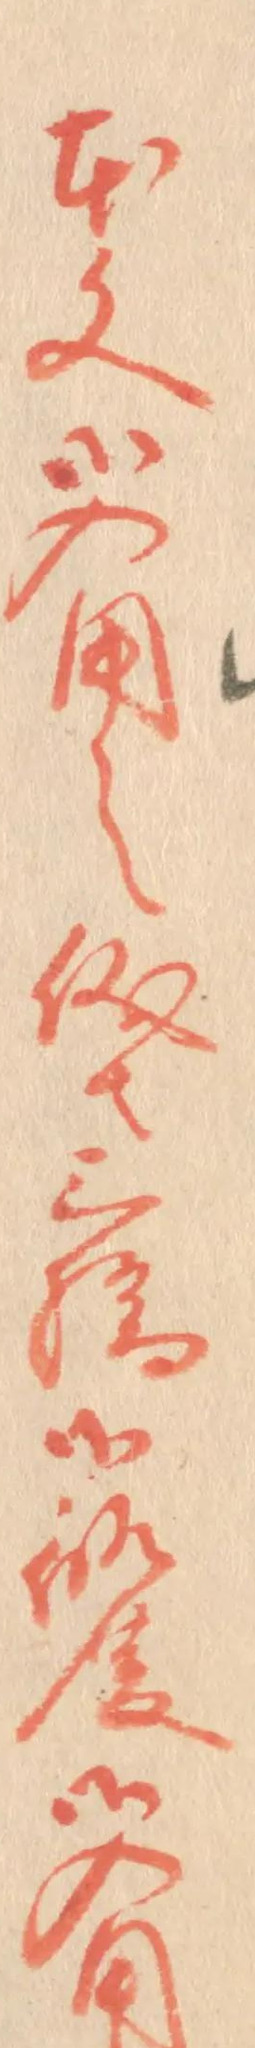本文御入用之儀は三橋御修復御入用
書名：三橋 17巻. [7] 三橋小破御修復書留　但御奉行御掛リ替地震潰橋番屋　嘉永四亥年より安政二卯年迄　上
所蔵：国立国会図書館 National Diet Library, JAPAN
